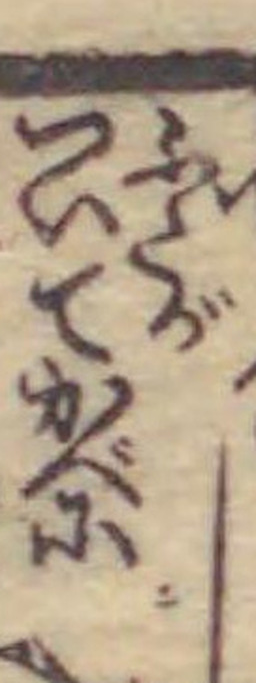ついてかべに
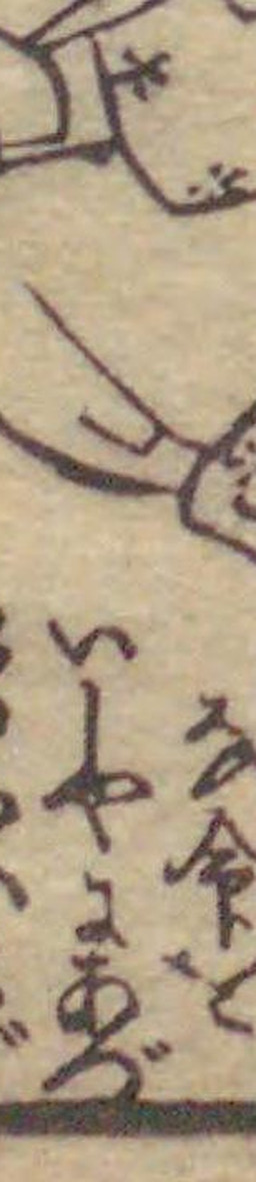いしやにあづ
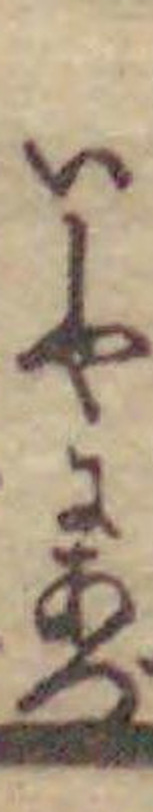いしやにあづ
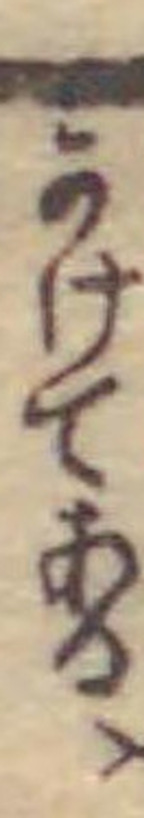かけてある
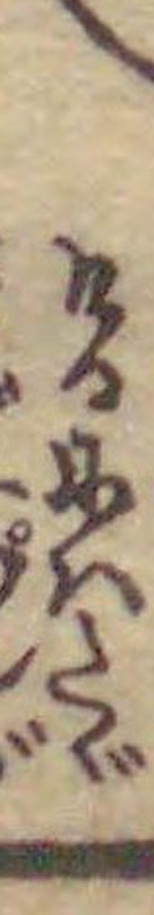けるにはたゞ
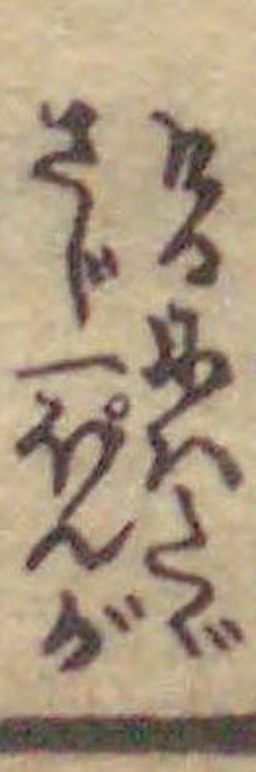さじ一ぽんが
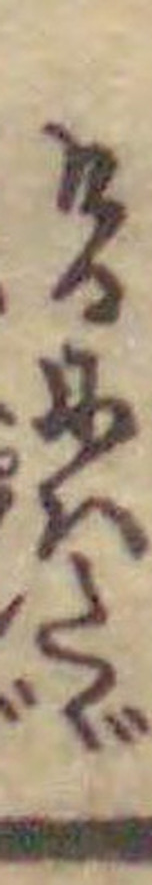けるにはたゞ
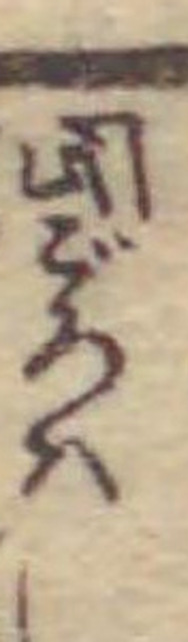〽此ごろは
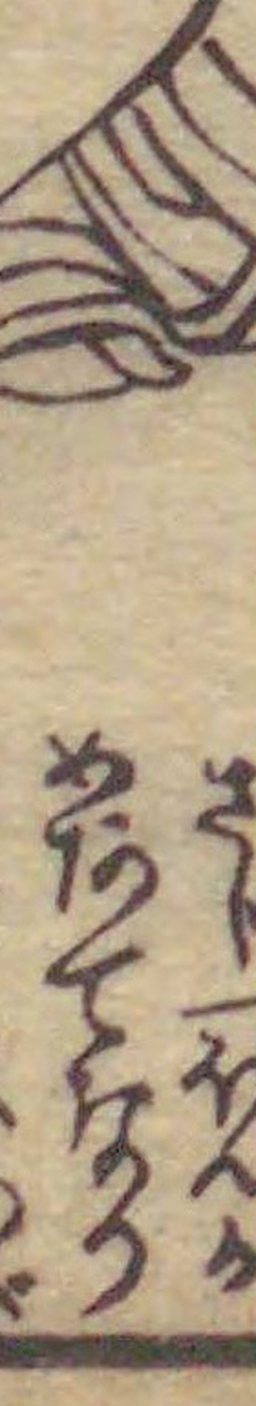めあてなり
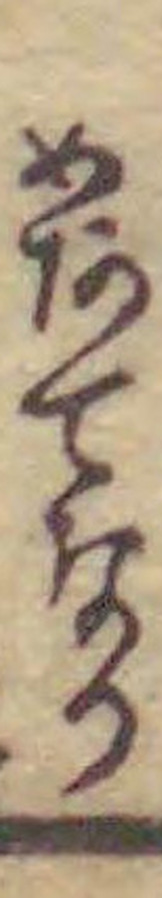めあてなり
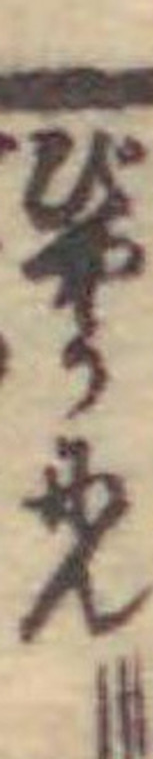びやうにん
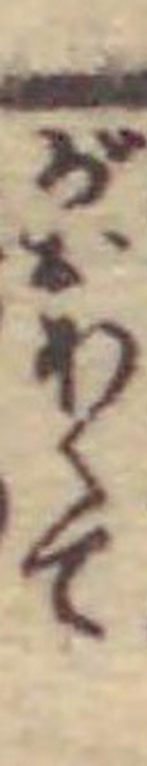がおほくて
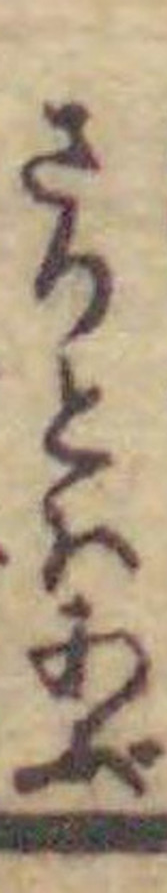さりとはあぶ
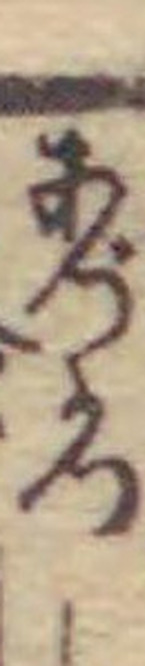あづかつ
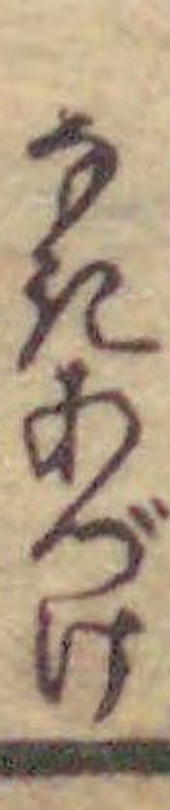なきあづけ
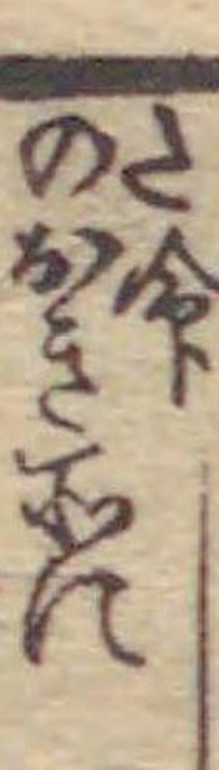のおき所に
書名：御誂染長寿小紋 : 3巻
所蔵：国立国会図書館 National Diet Library, JAPAN
